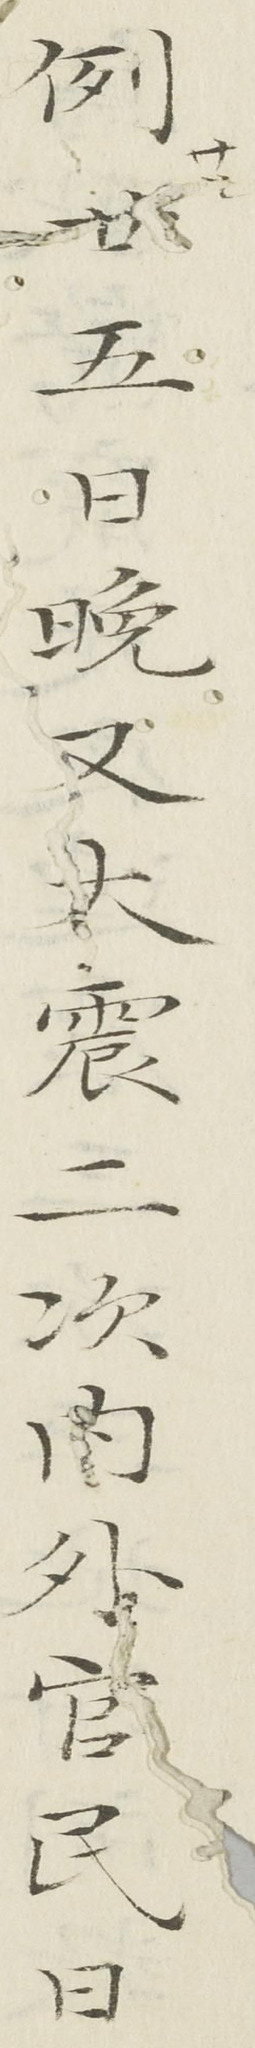例廿五日晩又大震二次内外官民日
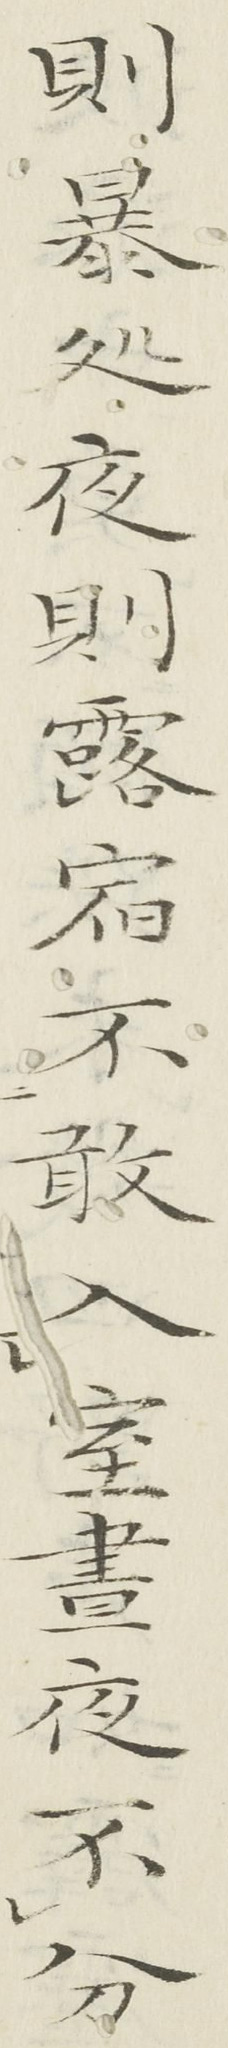則暴処夜則露宿不敢入室昼夜不分
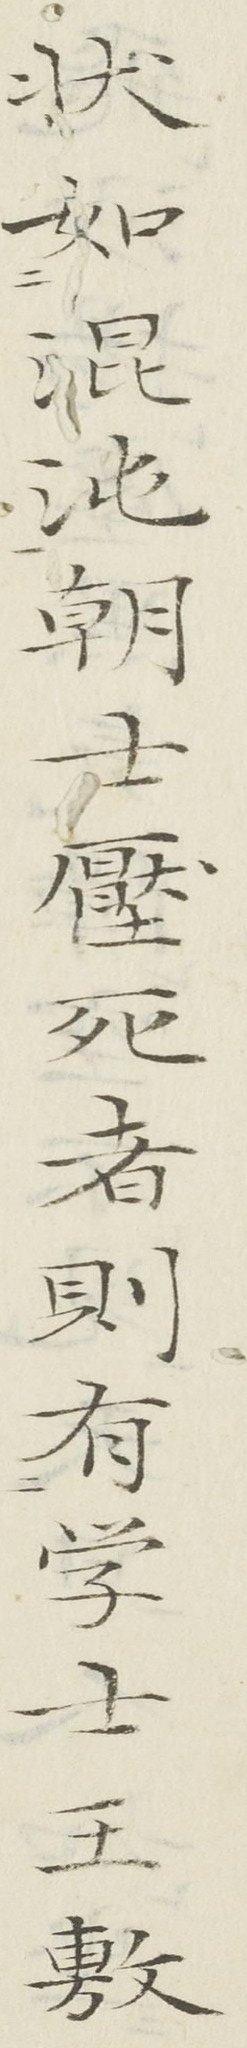状如混沌朝士圧死者則有学士王敷
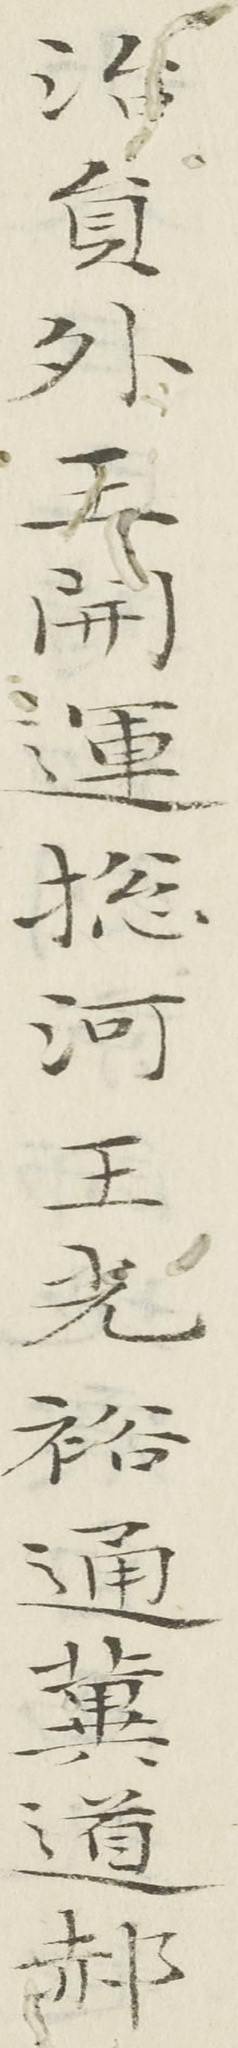治員外王開運捴河王光裕通冀道郝
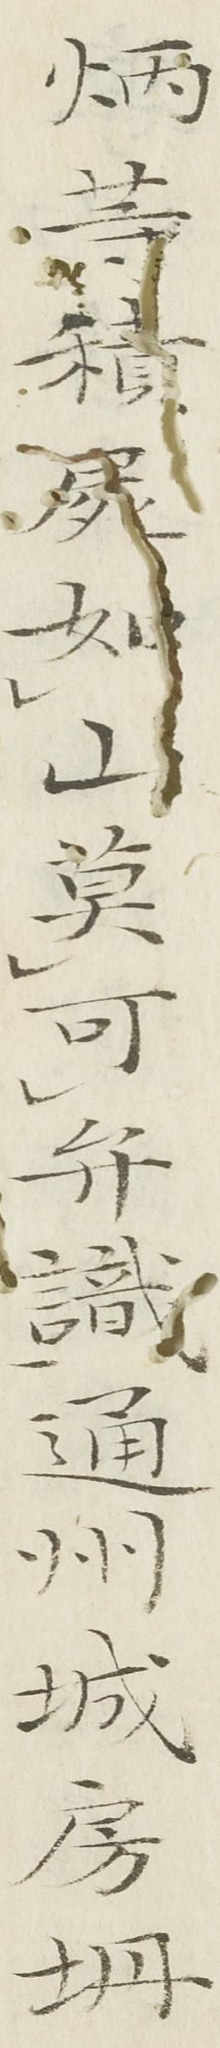丙等積屍如山莫可弁識通州城房坍
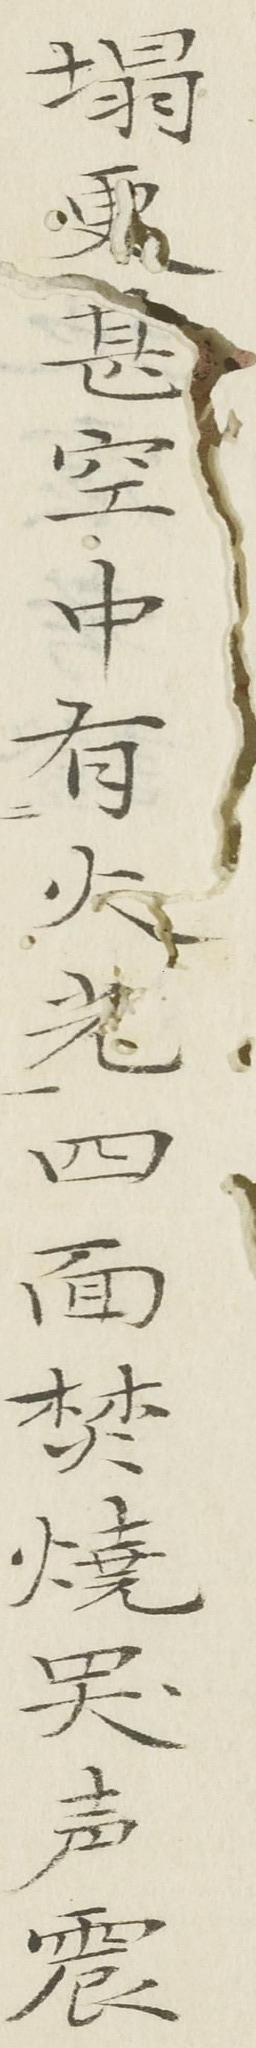搨更甚空中有火光四面梵焼哭声震
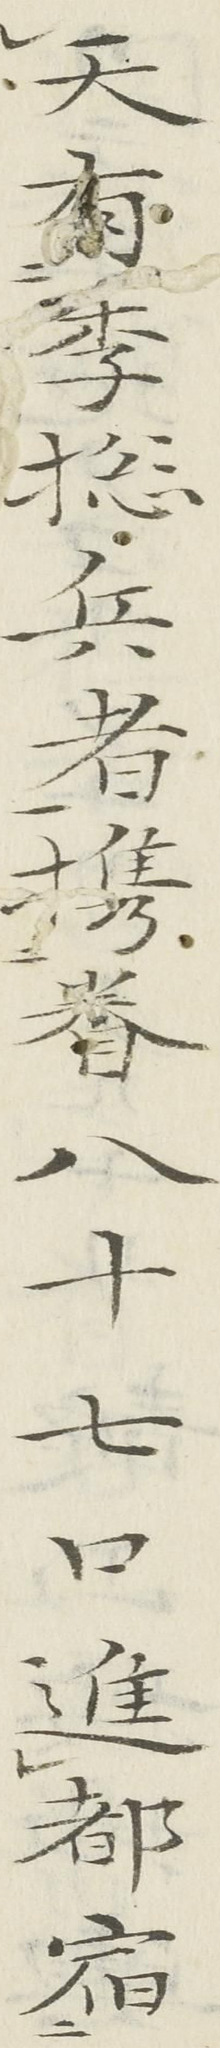天南李捴兵者携眷八十七口進都宿
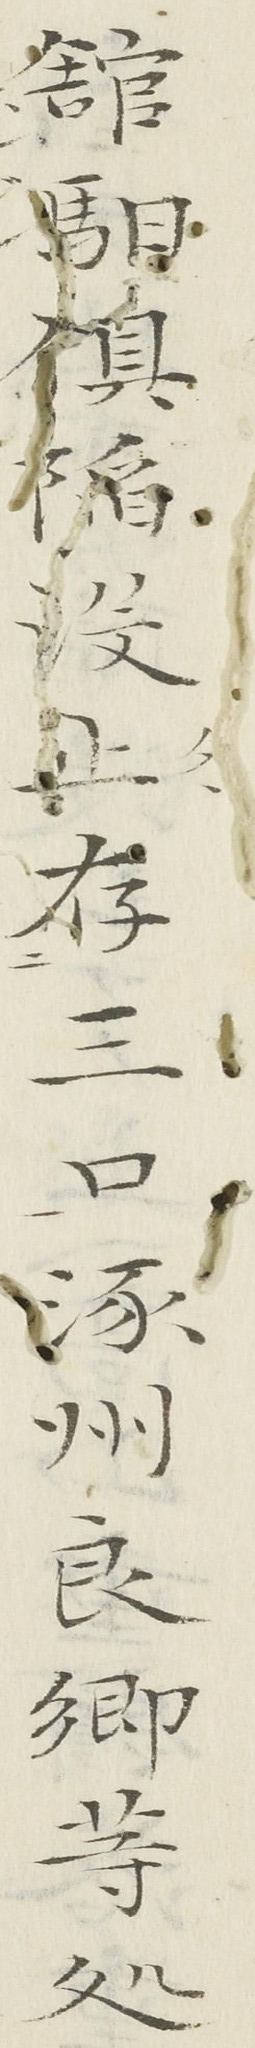館駔領陥没弥止存三口涿州良郷等処
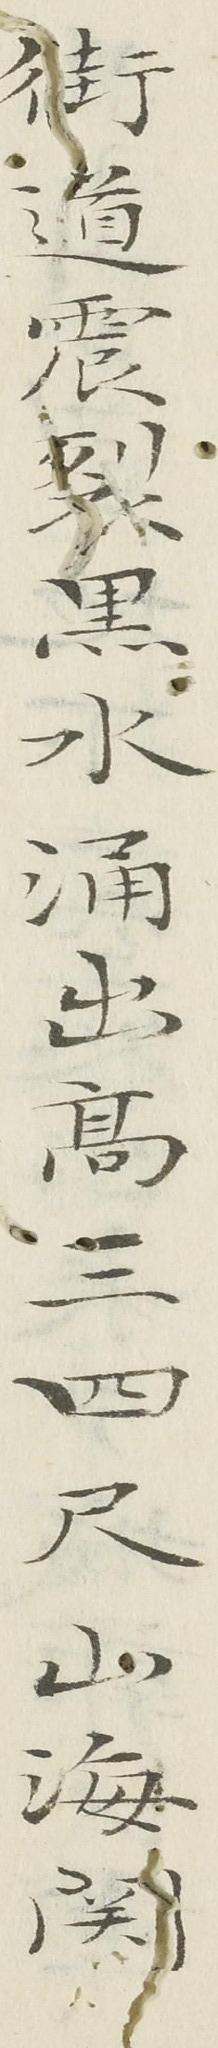街道震裂黒水涌出高三四尺山海関
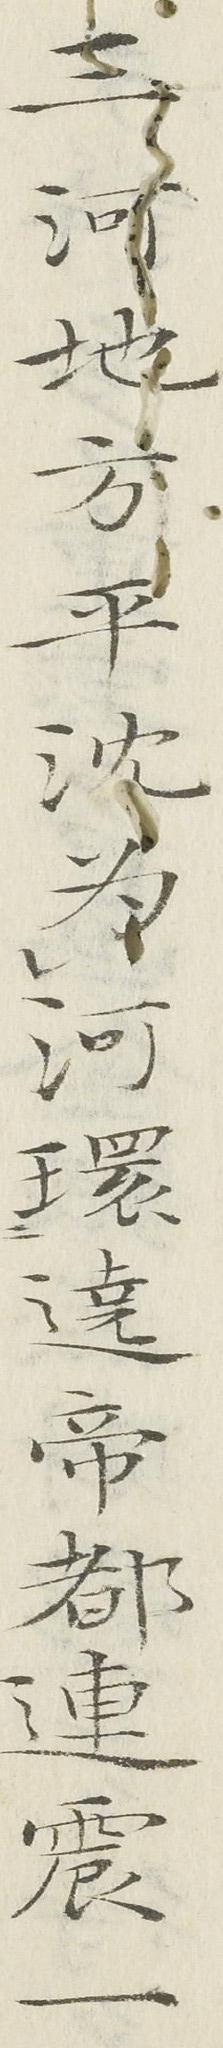三河地方平沈為河環遠帝都連震一
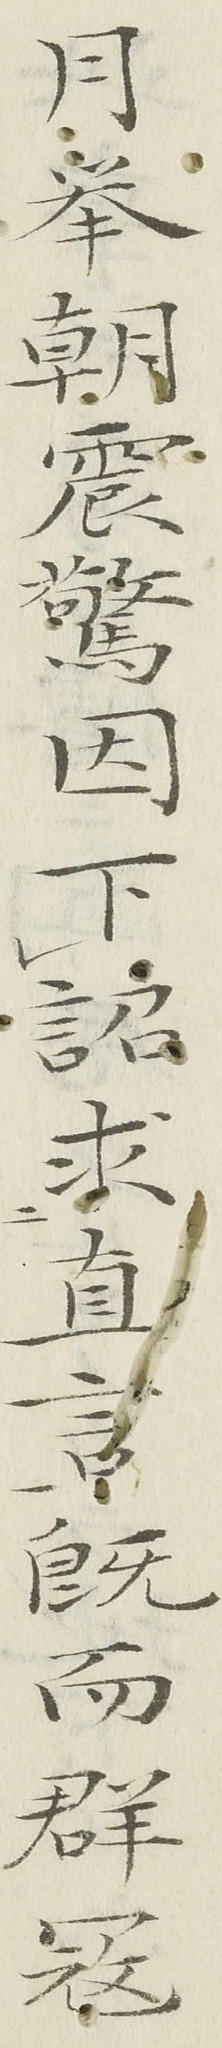月挙朝震驚因下詔求真言既而群寇
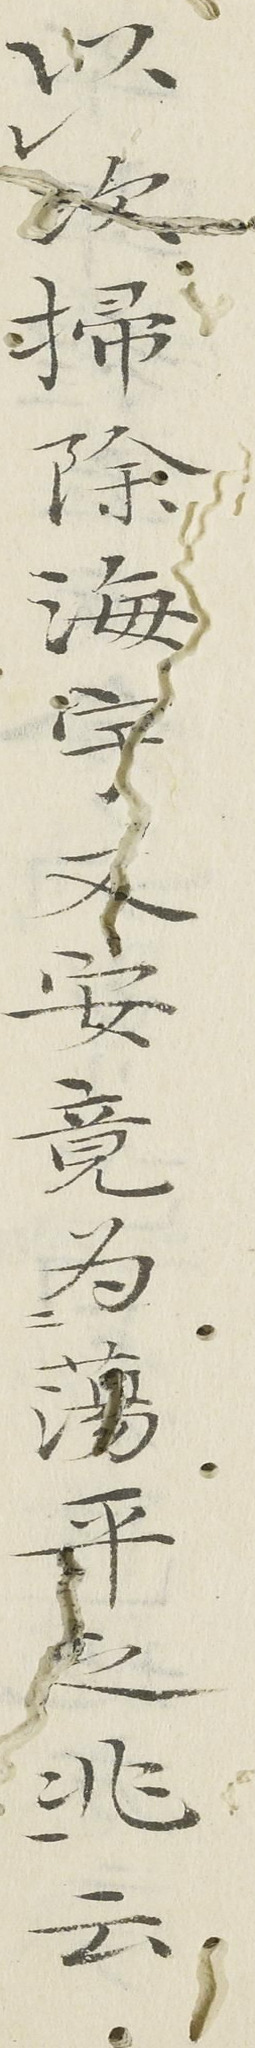以次掃除海宇又安竟為蕩平之兆云
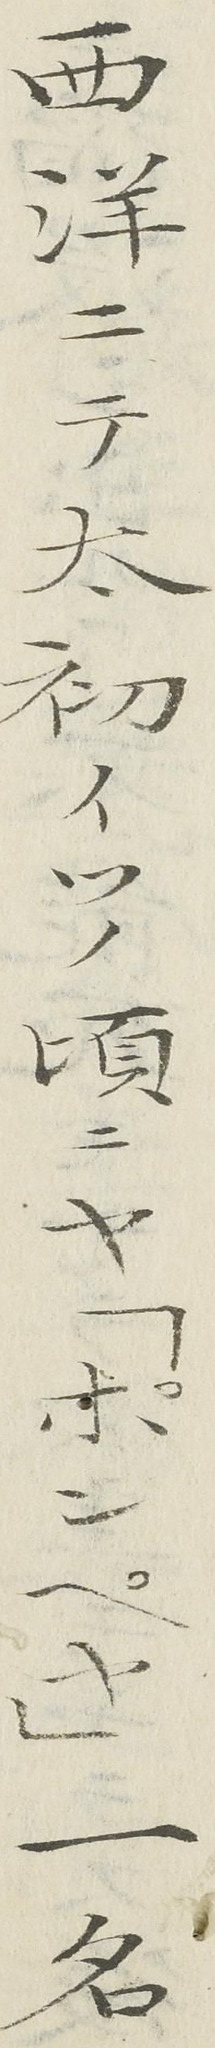西洋ニテ太初イツノ頃ニヤ「ポンペヤ」一名

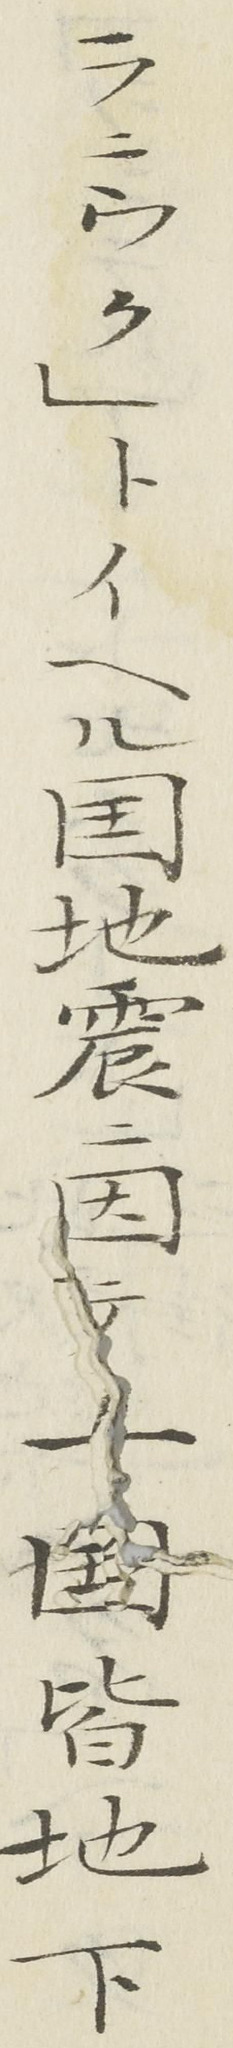ラニウク」トイヘル国地震ニ因テ一国皆地下
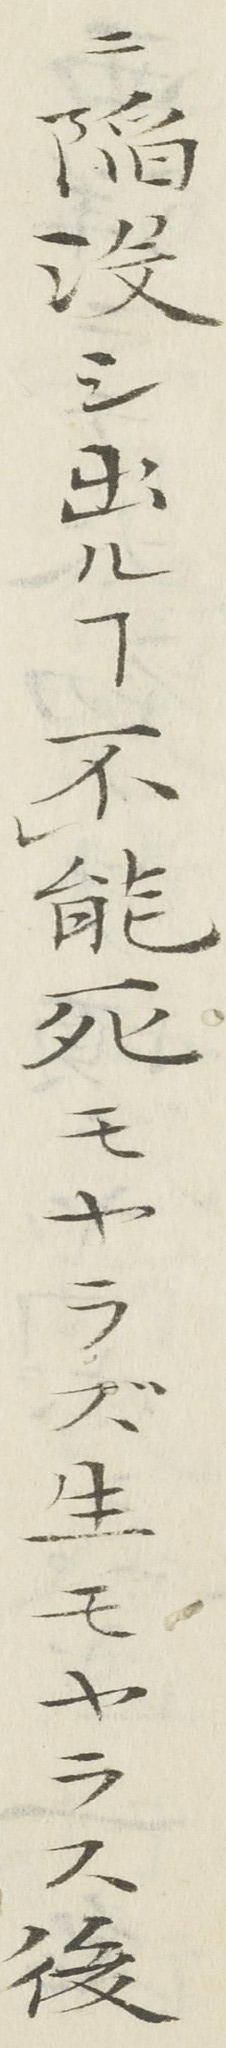ニ陥没シ出ルヿ不カエリ能死モヤラズ生モヤラス後
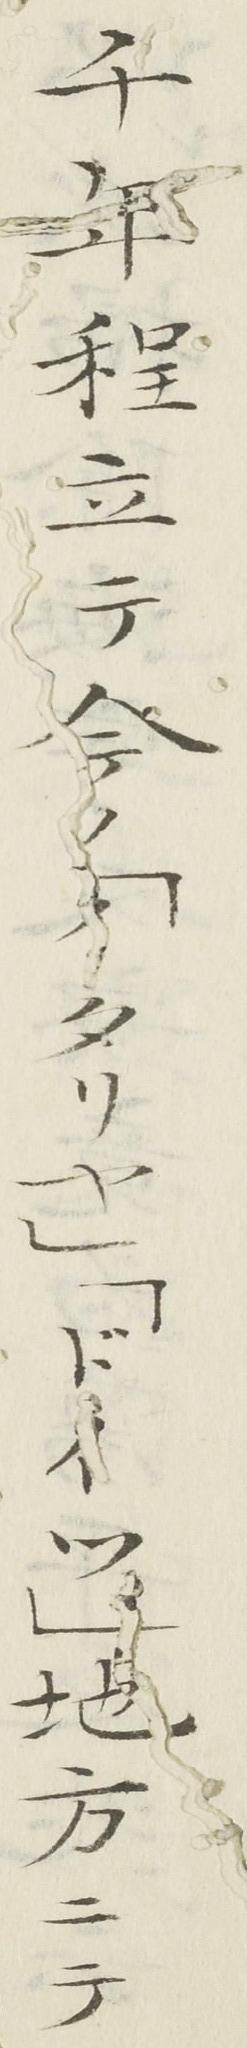先年程立テ今ノ「イタリヤ」「ドイツ」地方ニテ
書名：地震考證　全
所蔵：東京大学地震研究所図書室 Earthquake Research Institute Library, The University of Tokyo, JAPAN
